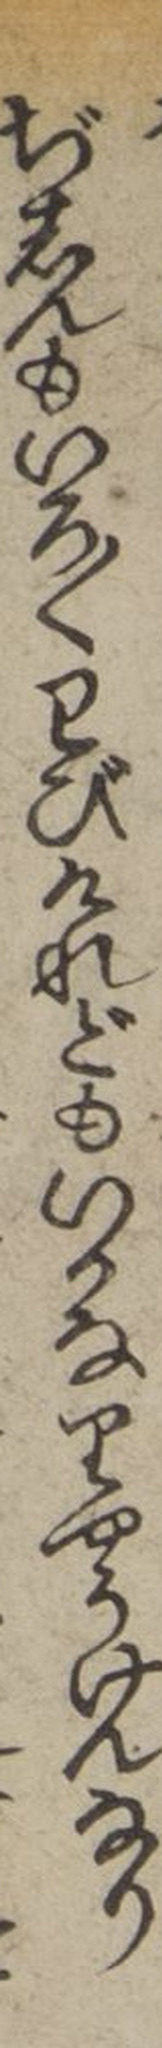ぢしんもいろ〳〵わびけれどもいかなりやうけんなり
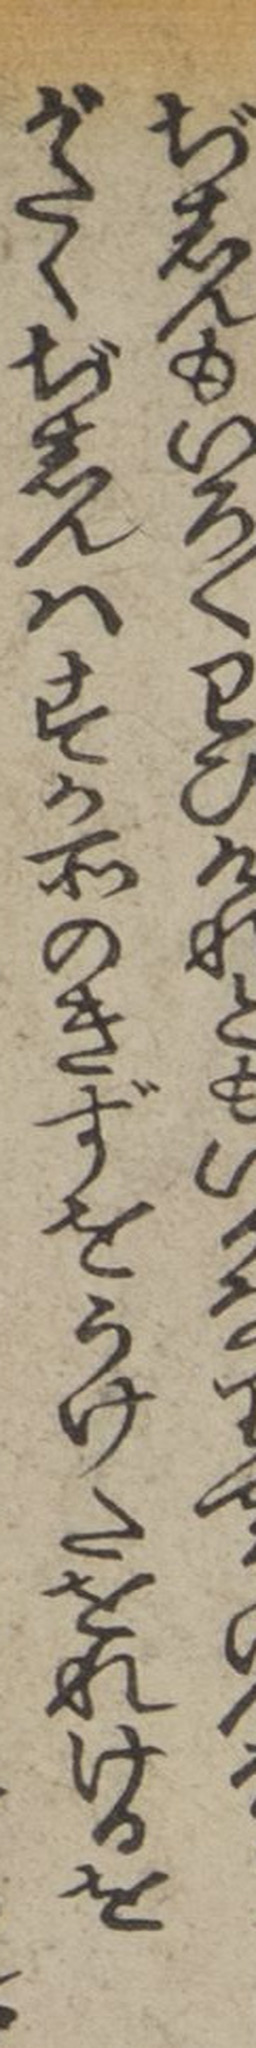がたくぢしんはすか所のきずをうけたをれけるを
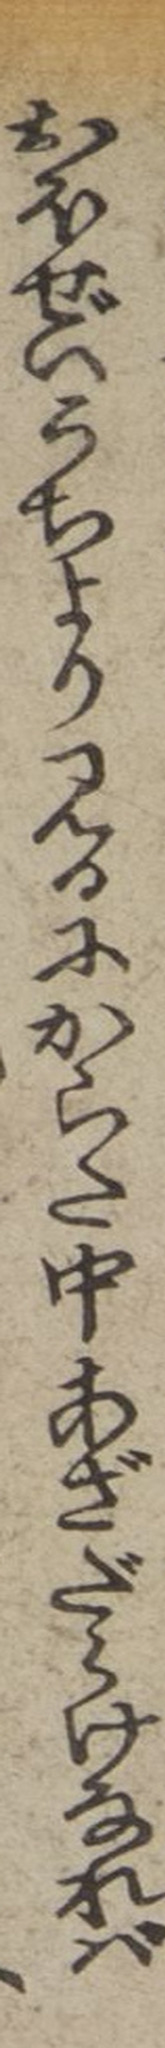おほぜいうちより見るにからた中あざだらけなれば
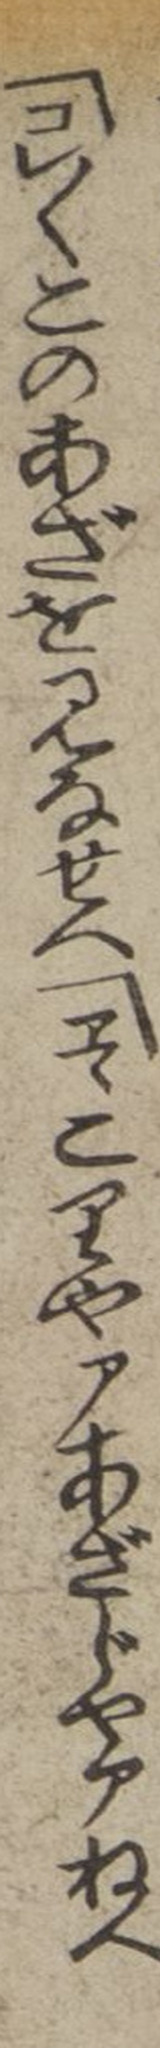〽コレ〳〵このあざを見なせへ〽ヱゝこりやァあざじやァねへ
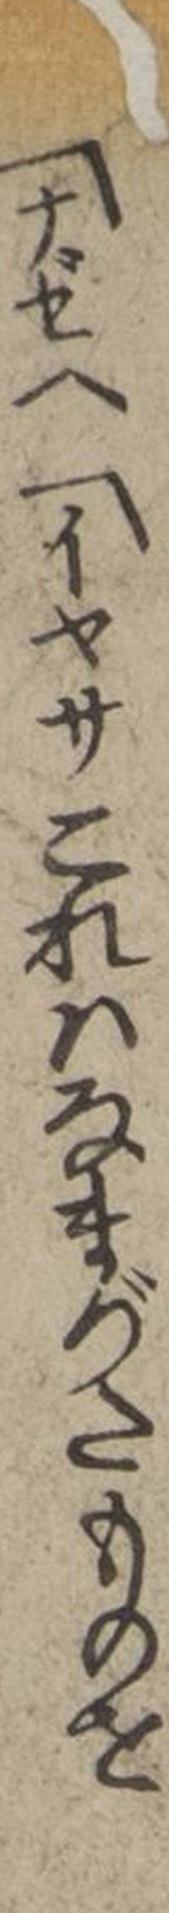〽ナゼヘ〽イヤサこれはなまづたものを
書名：即席鯰はなし
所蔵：あいおいニッセイ同和損保株式会社
